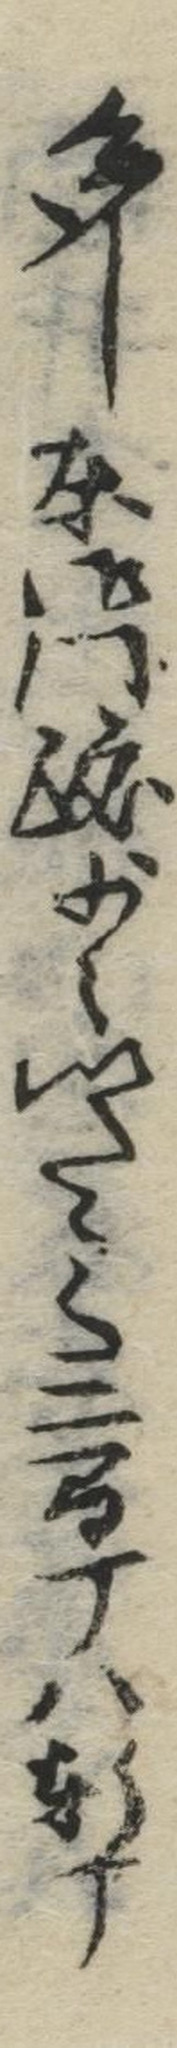多し東御門跡少しいたみ三間丁八軒丁
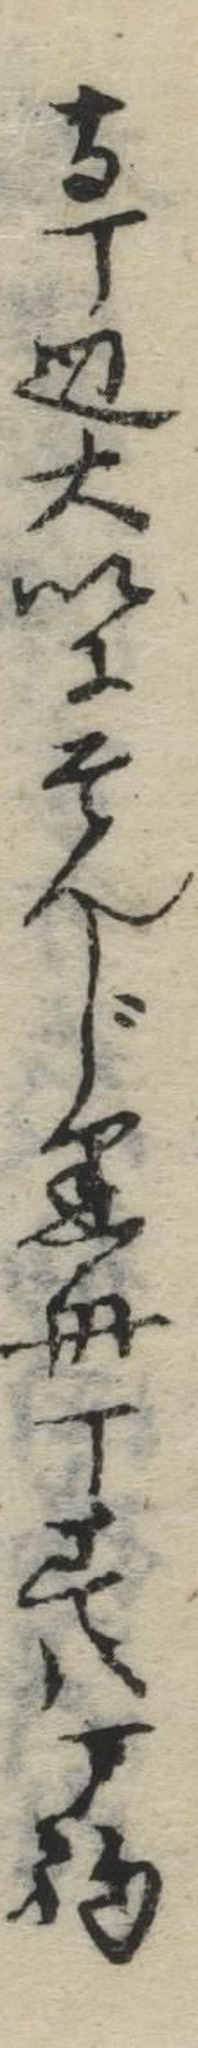寺丁辺大いにそんじ黒舟丁すは丁駒
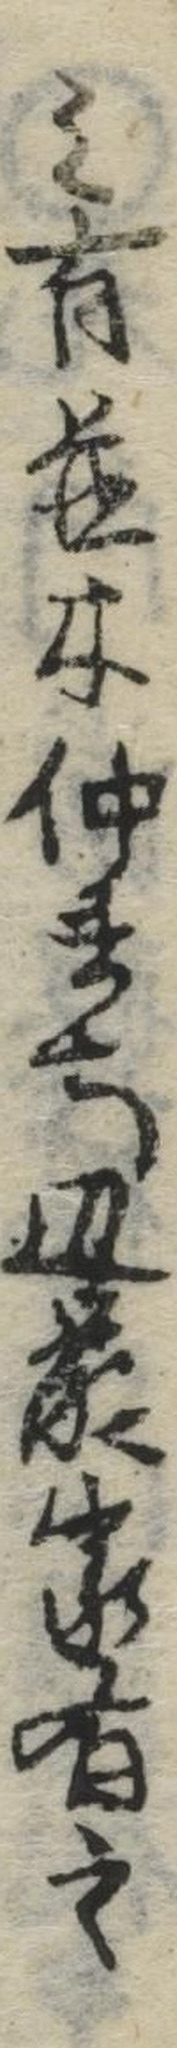み有並木仲まち辺崩家有之
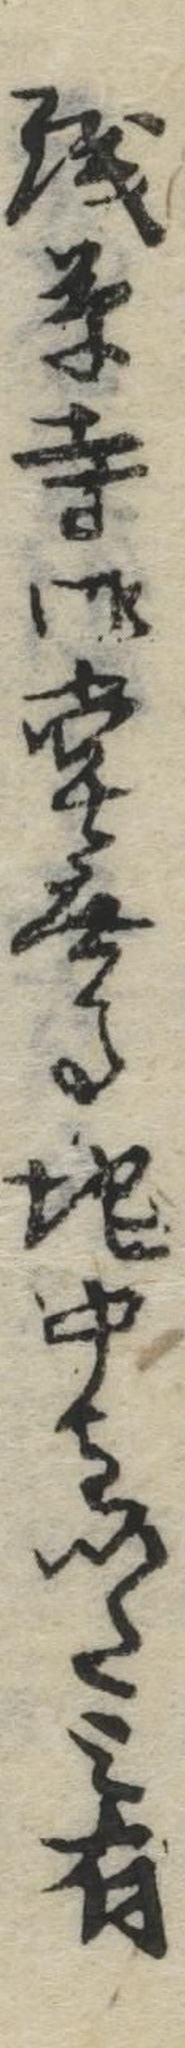浅草寺御堂無事地中寺いたみ有
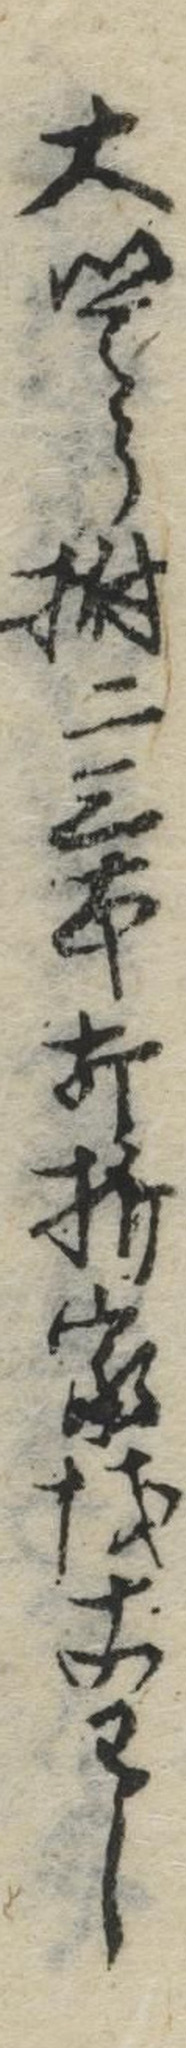大いてう樹二三本打折家をこわし
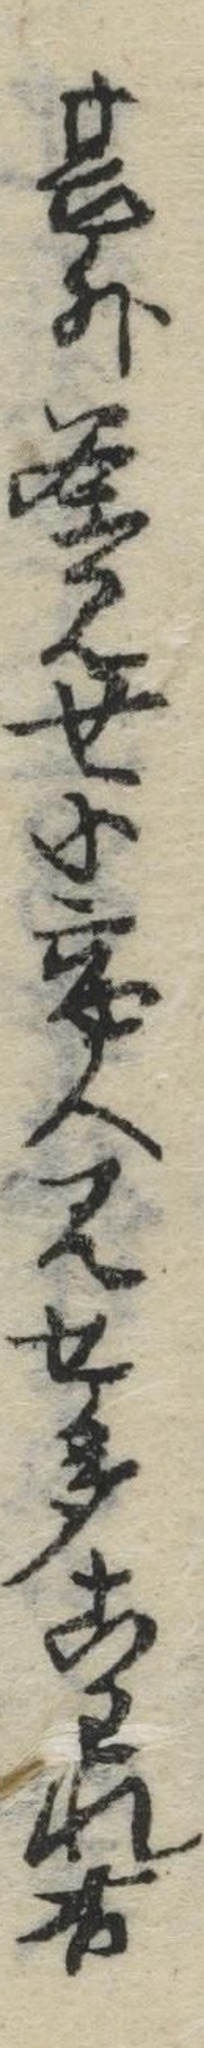其外茶みせにて人みせ多こわれ有
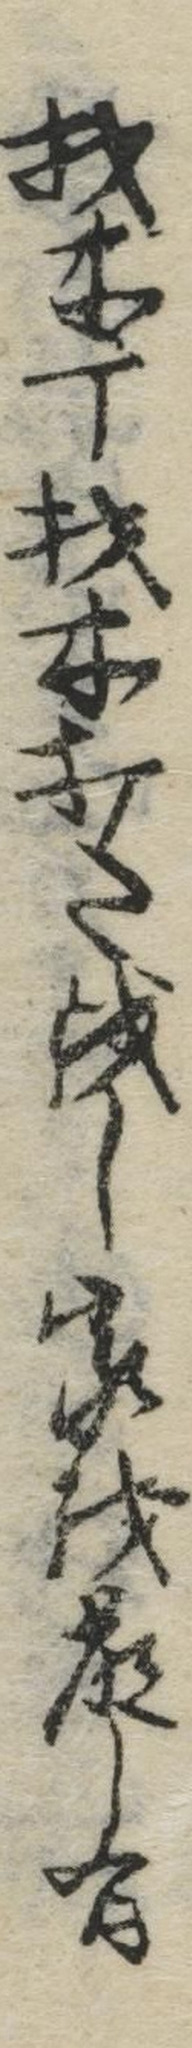材木丁材木打たをし家を崩し有
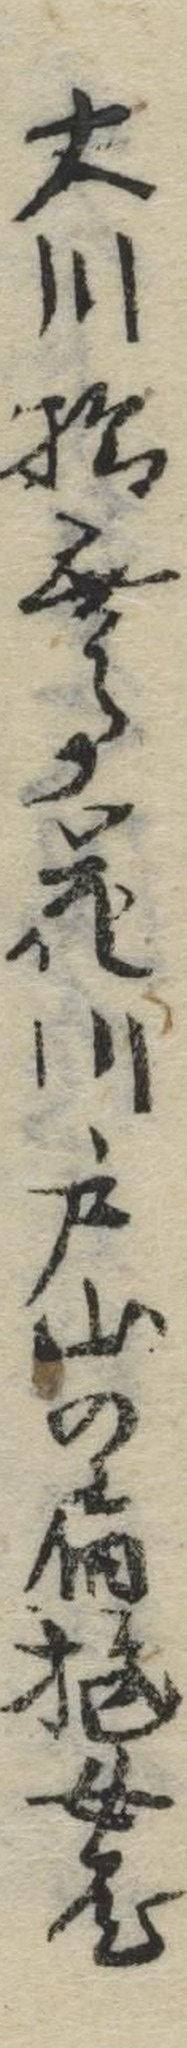大川橋無事花川戸山の宿遊女屋
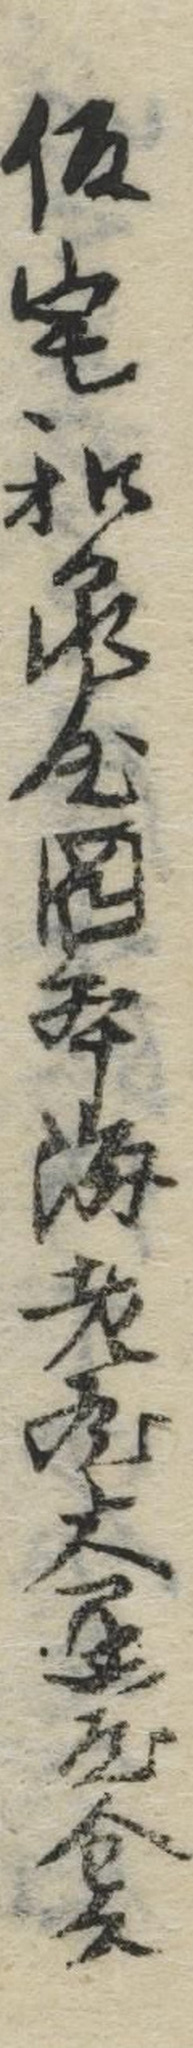仮宅和泉屋岡本海老屋大黒屋金久
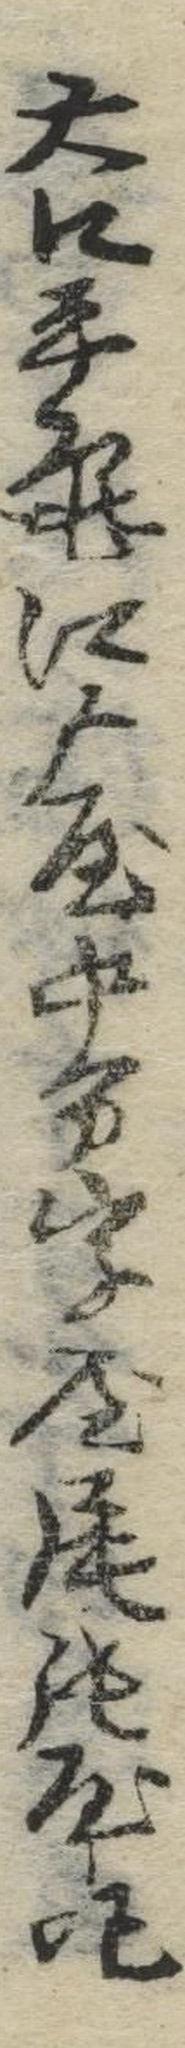大口平赤？江戸屋中万字屋尾張屋旺？
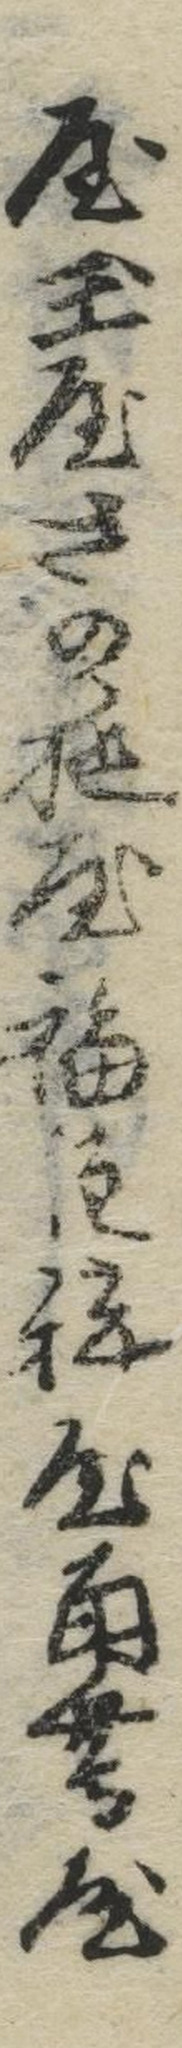屋玉屋さの槌屋福住秤屋南蔦屋
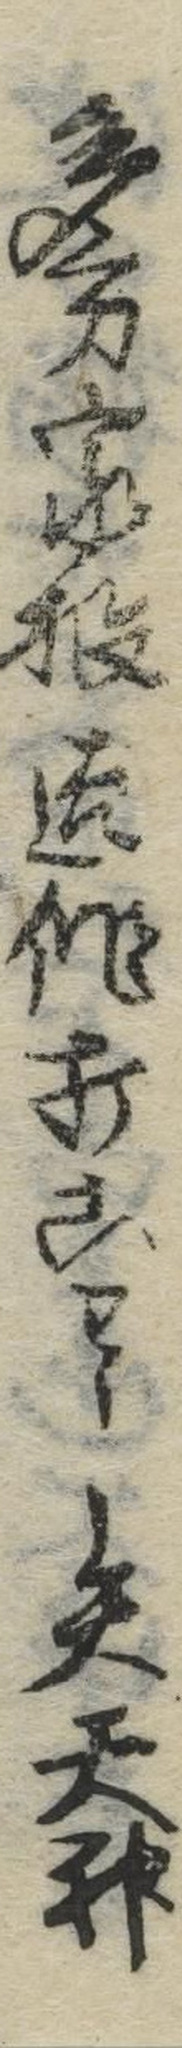多方家根造作打こわし矢天神
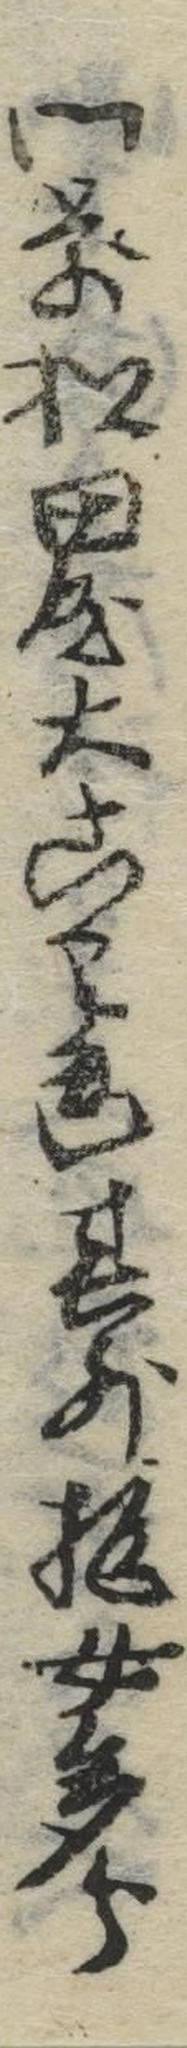門前松田屋大こわれ其外遊女多分
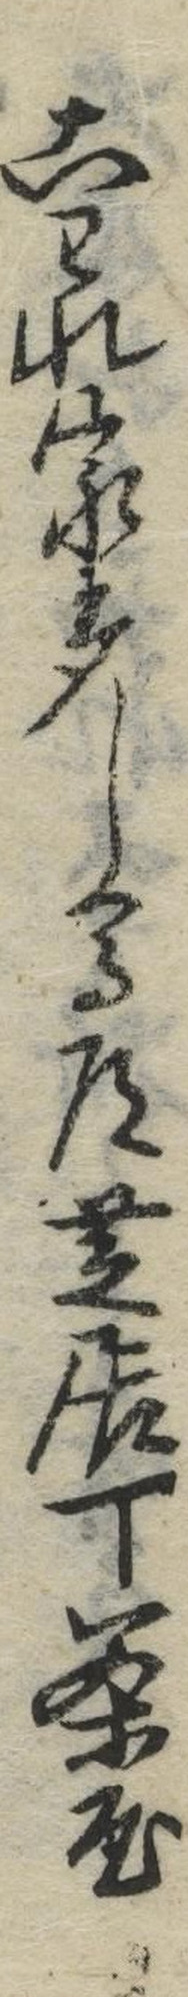こわれ家多し馬屋芝居丁茶屋
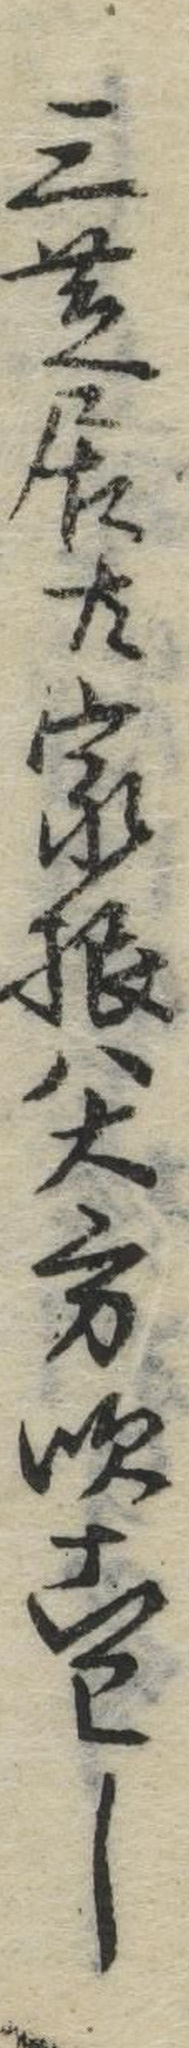三芝居共家根は大方吹こわし
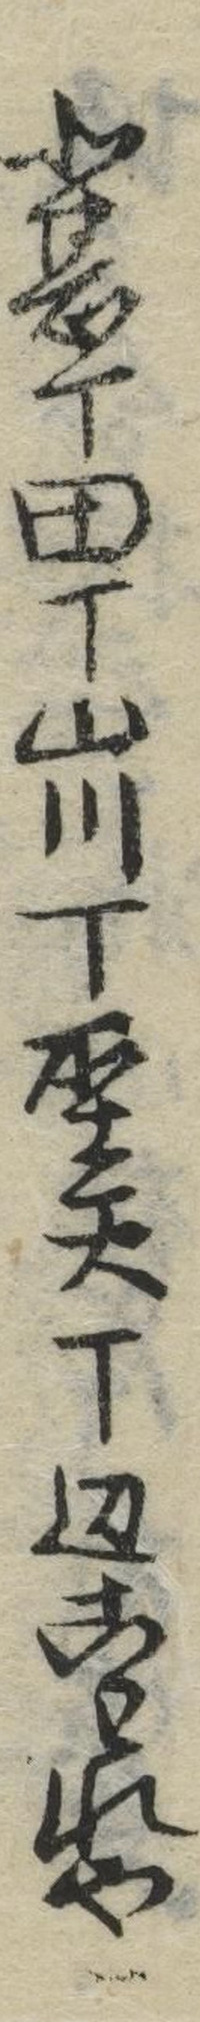北甚丁田丁山川丁聖天丁辺こわれや
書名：安政三年辰八月廿五日夜　大江都御屋敷方寺社市中共　大嵐水入場所明細書之寫　并街道筋近郷聞書
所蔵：東京大学地震研究所図書室 Earthquake Research Institute Library, The University of Tokyo, JAPAN
